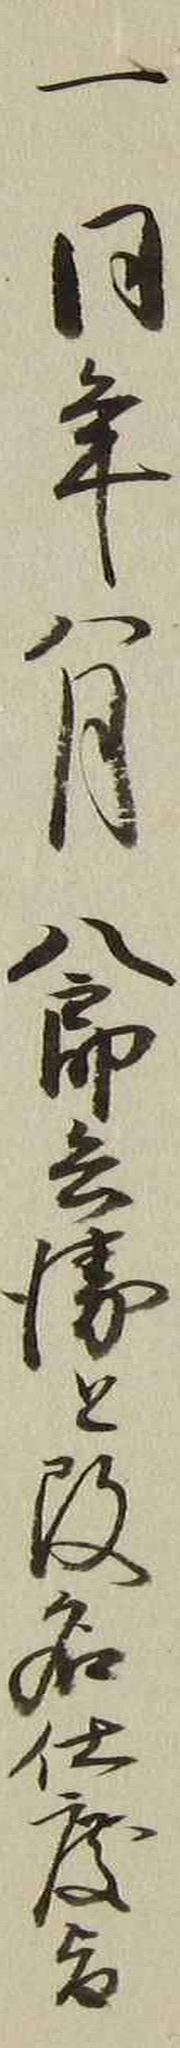一同年八月八郎兵衛と改名仕度旨
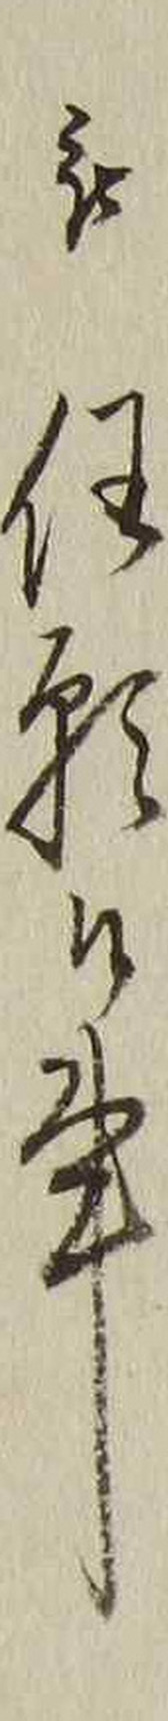被任願候事
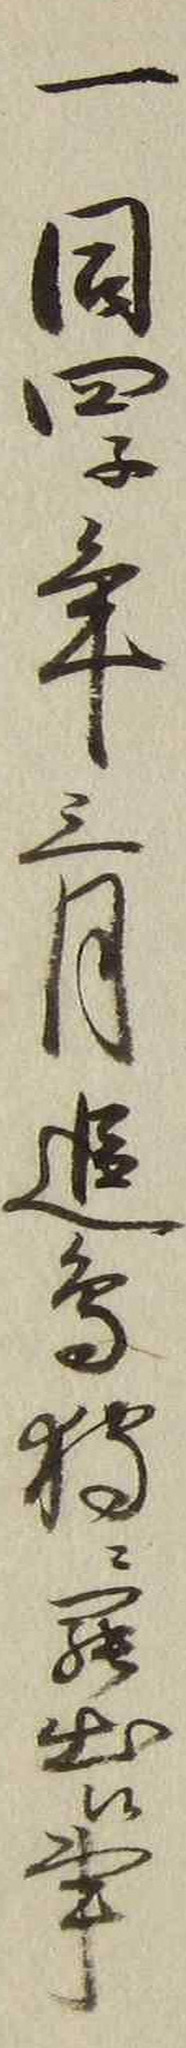一同四子年三月追鳥狩に罷出候事
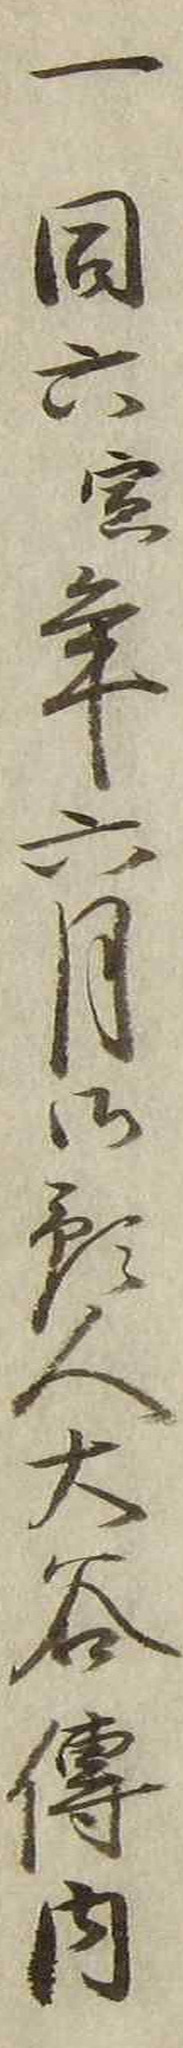一同六寅年六月御預人大谷伝内

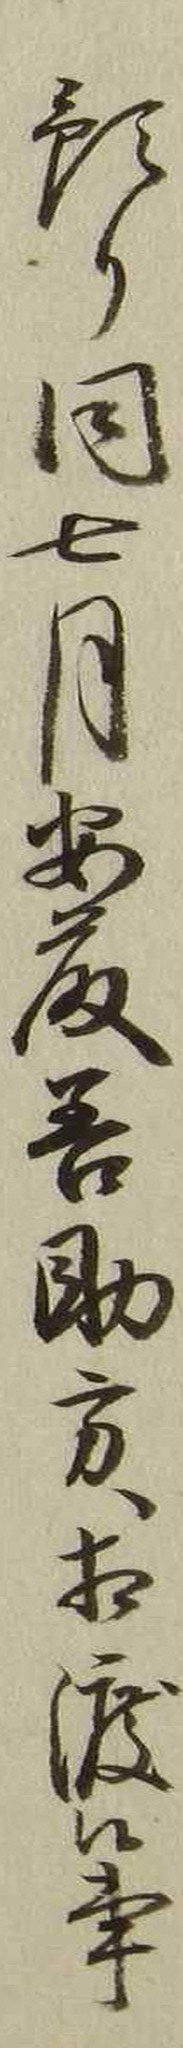預り同七月安藤善助方へ相渡候事
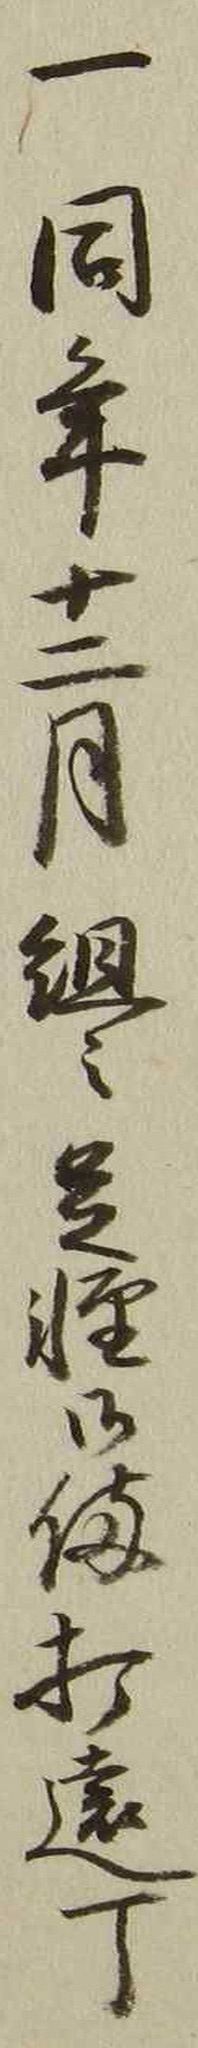一同年十二月組之足軽御備打遠丁
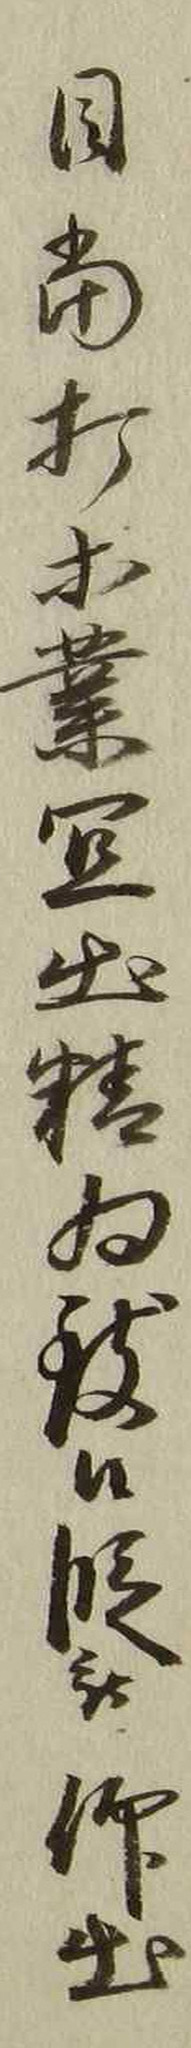目当打等業宜出精為致候段被仰出
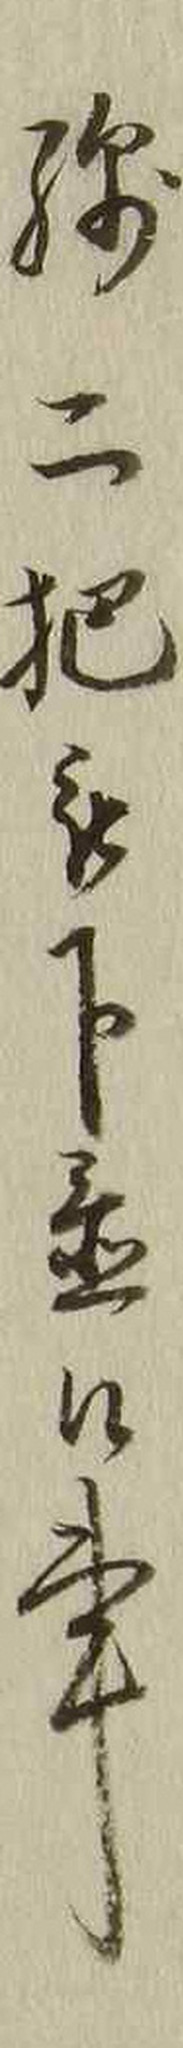綿二把被下置候事
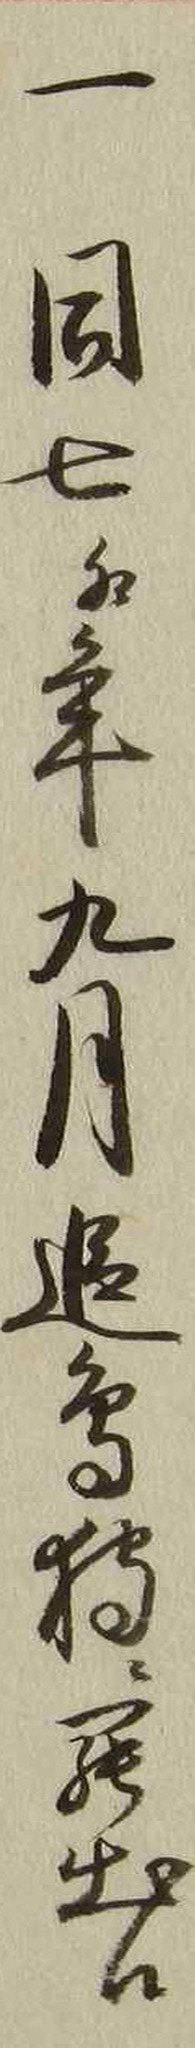一同七卯年九月追鳥狩に罷出候
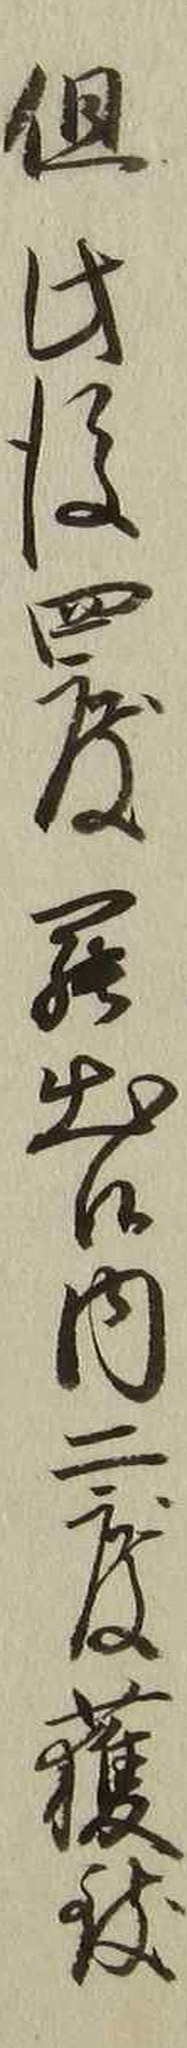但此後四度罷出候内二度獲致
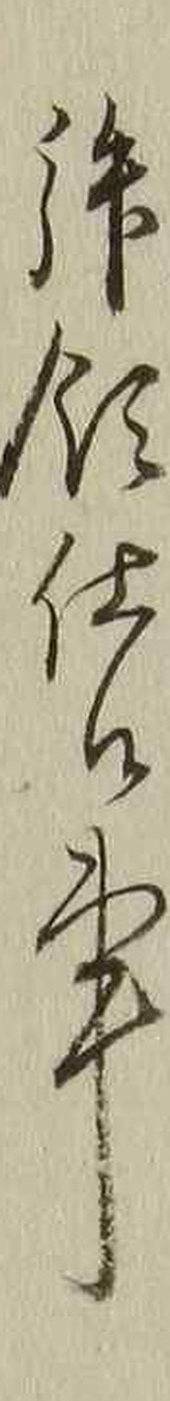拝領仕候事
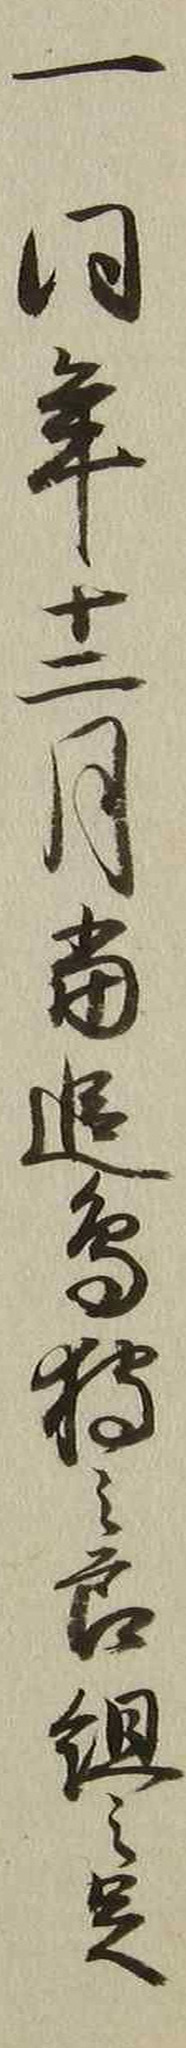一同年十二月当追鳥狩之節組之足
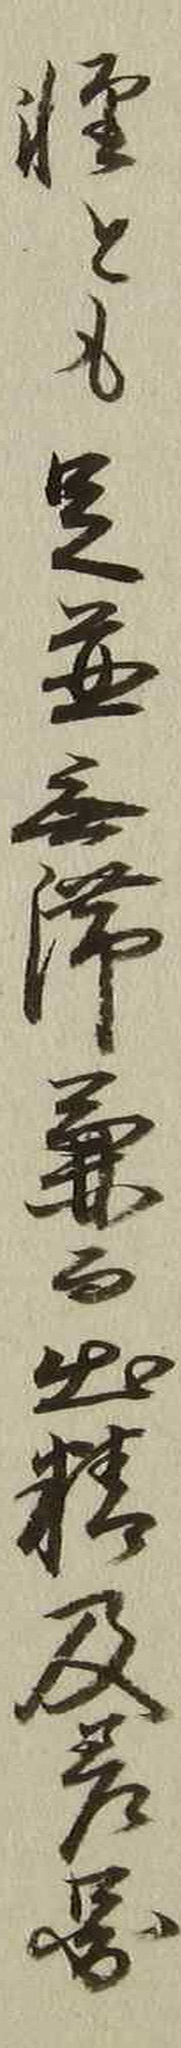軽とも足並無滞兼而出精及差図
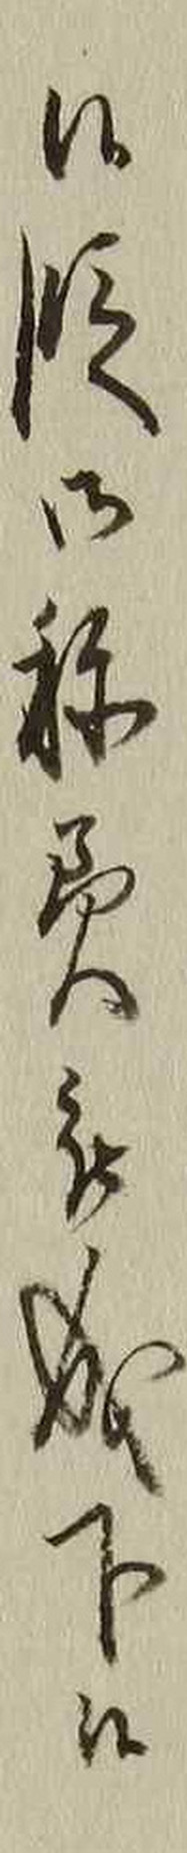候段御称美被成下候
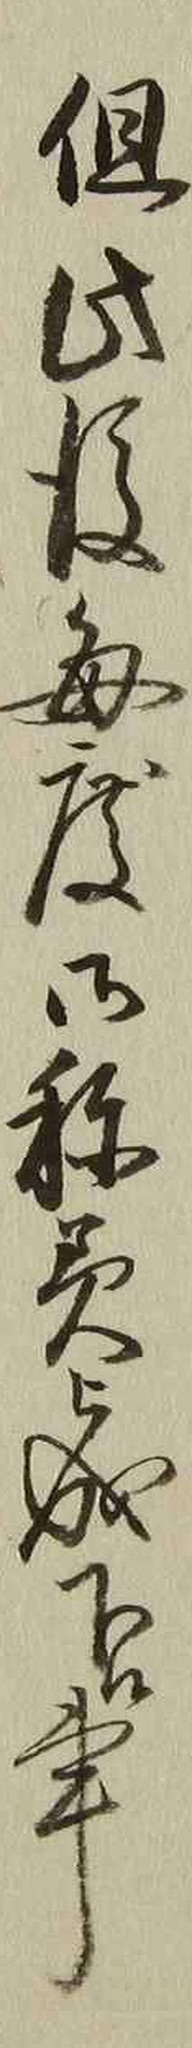但此後毎度御称美被成下候
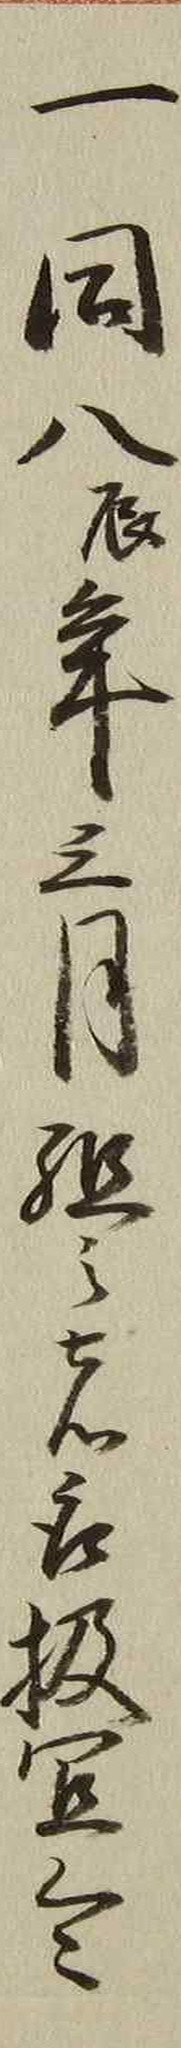一同八辰年三月組之者取扱宜令
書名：諸士系譜　巻之133　た之部9
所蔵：会津若松市立会津図書館
